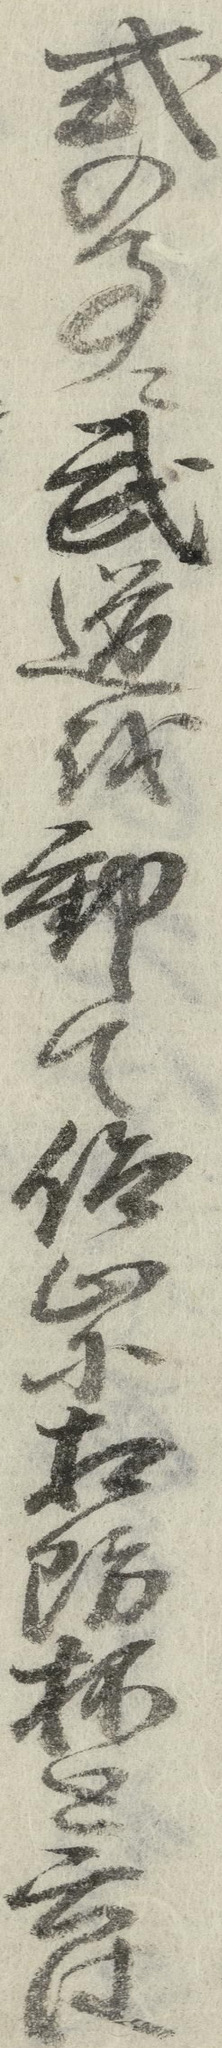式の事に武道を動して仰正に相防抔と云は
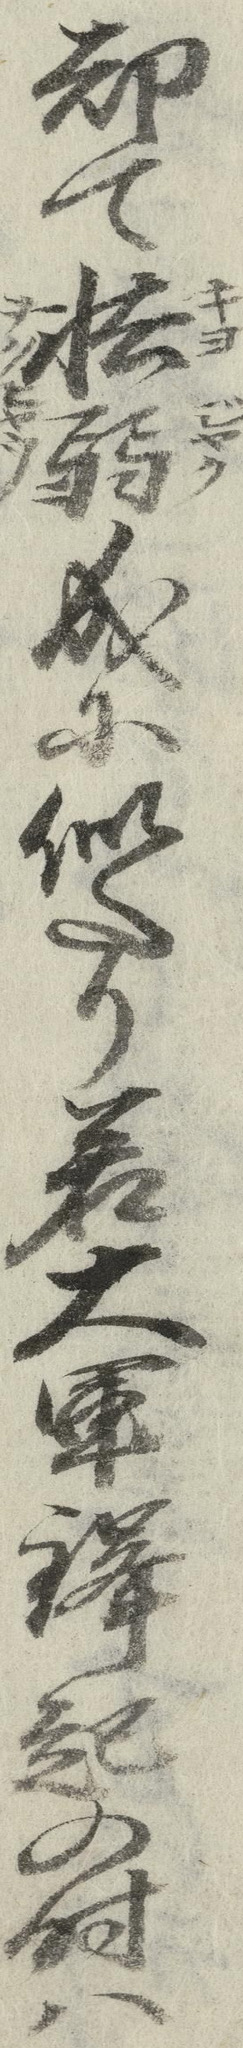却て袪弱成に似たり若大軍鋒起の時は
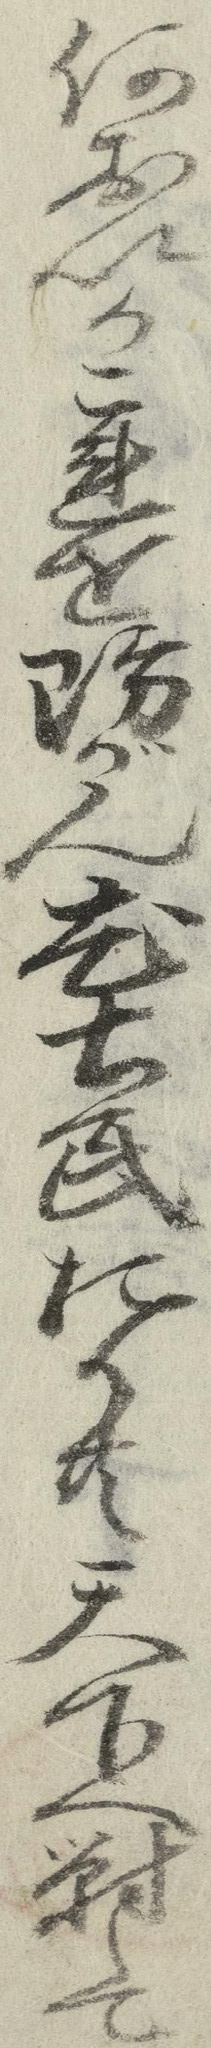何お以かこれを防がん尤土民たり共天下へ対して
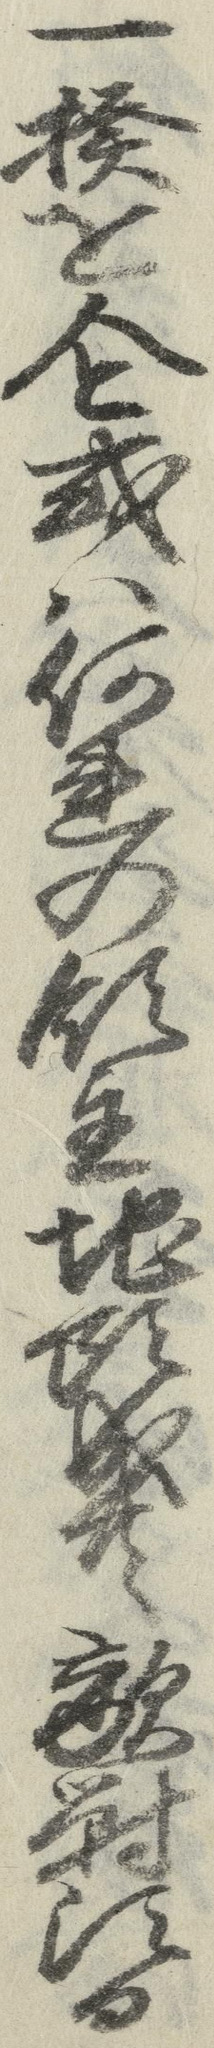一揆を企或は何れの領主地頭成共敵対する
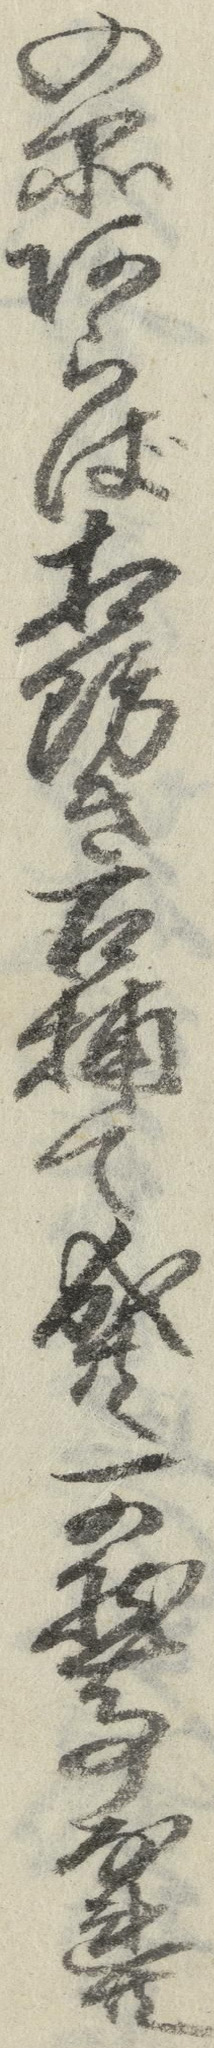の所あらば相防き召捕て成共可然事なれ共
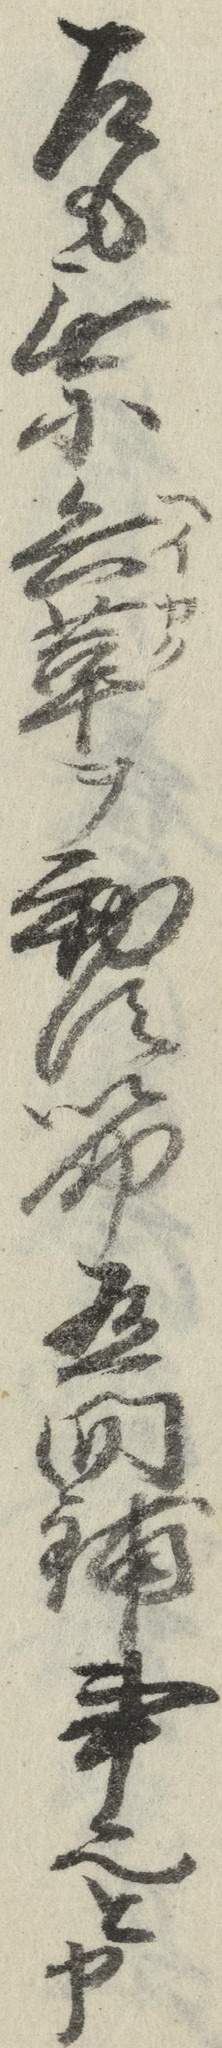さも無に兵革ヲ動す筋有間鋪事也と申
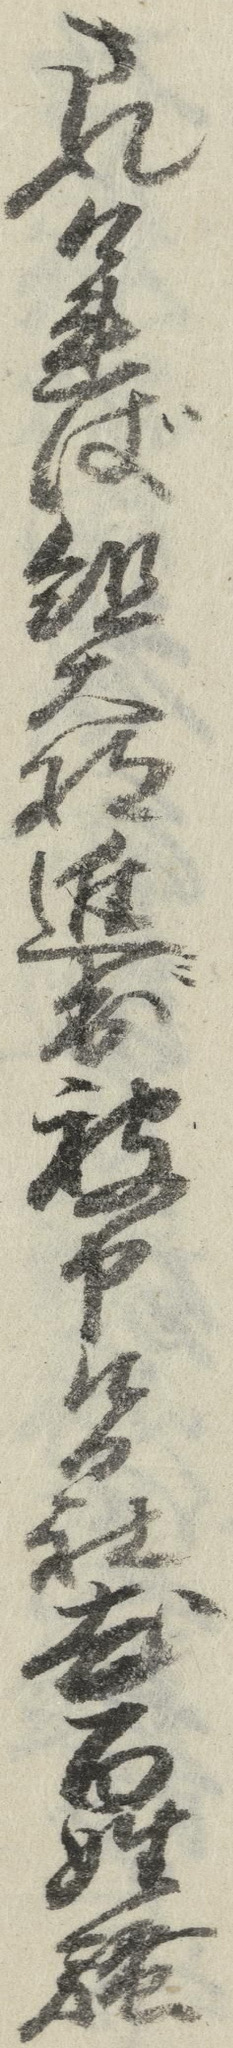されければ組大将進み出被申ける然尤百姓騒
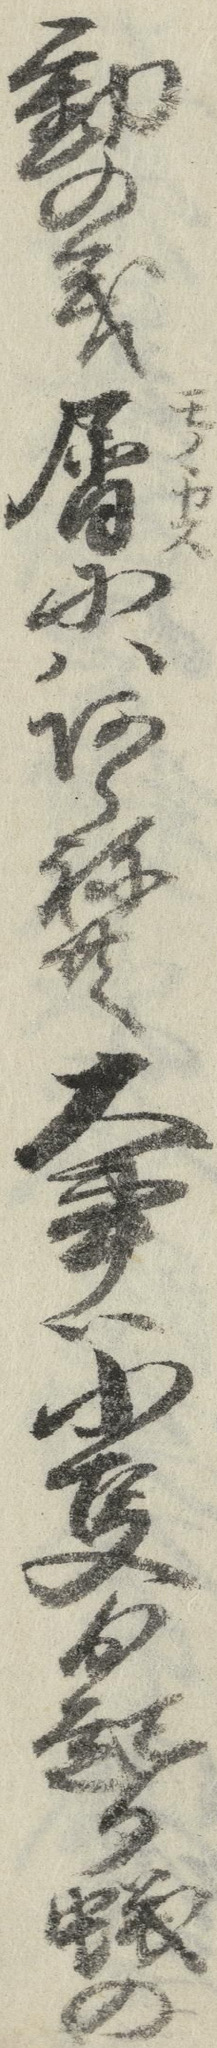動の義-屑にはあらね共大事は小事ゟ起り蟻の
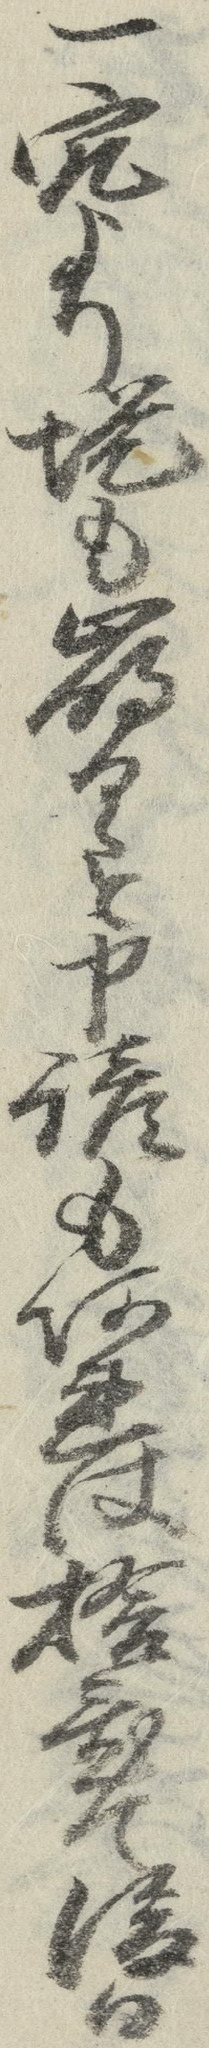一穴より堤も崩ると申諺もあれは捨置て後日
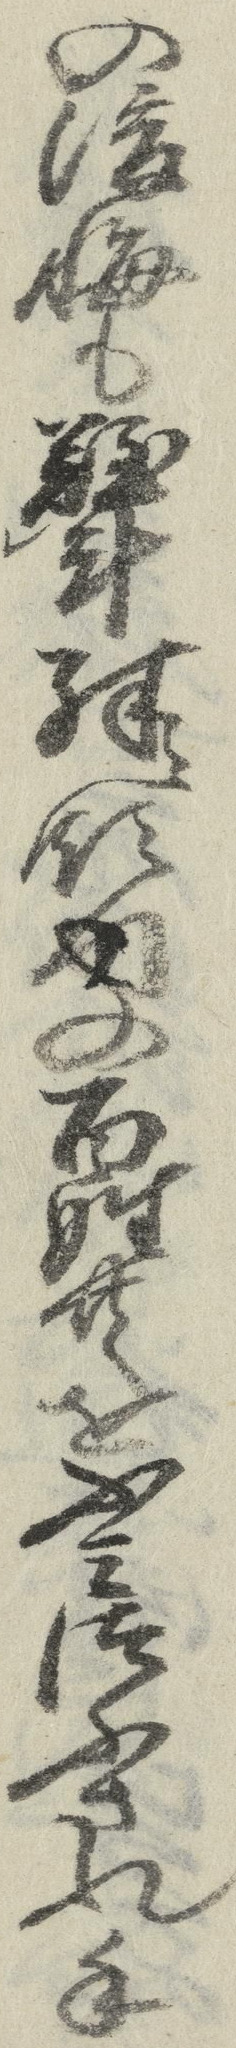の後悔も難計殊に領内の百姓共をふみつふされ手
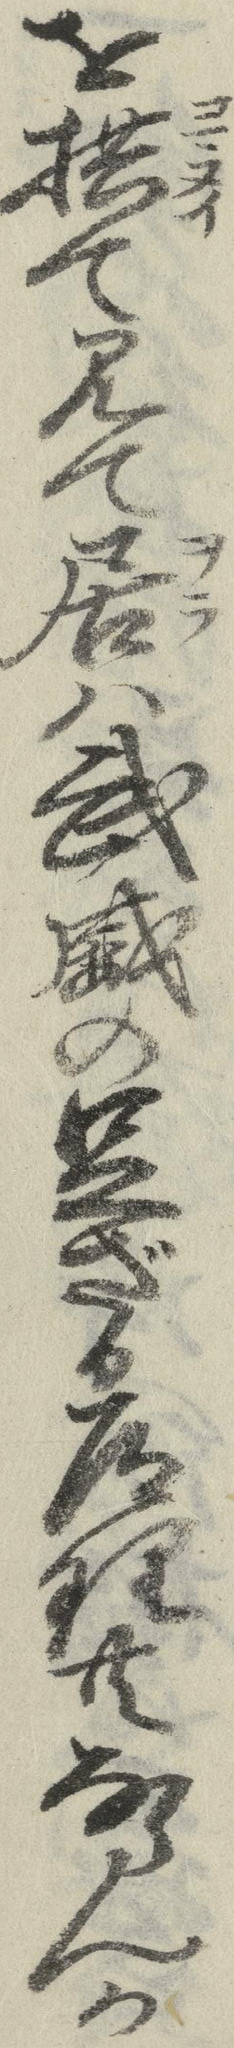を拱て見て居は武威の足ざる道理共ならんか

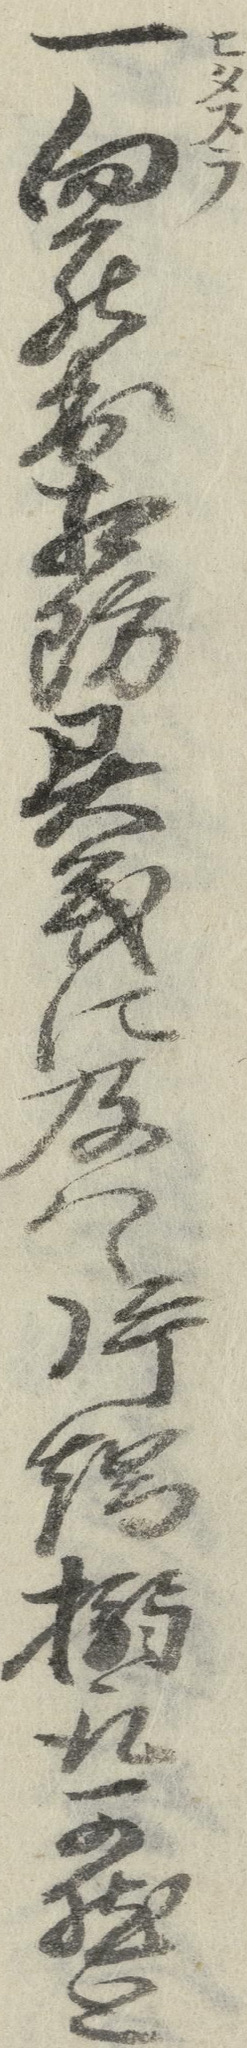一向罷出相防旲義に及はヽ片端搦取可然と
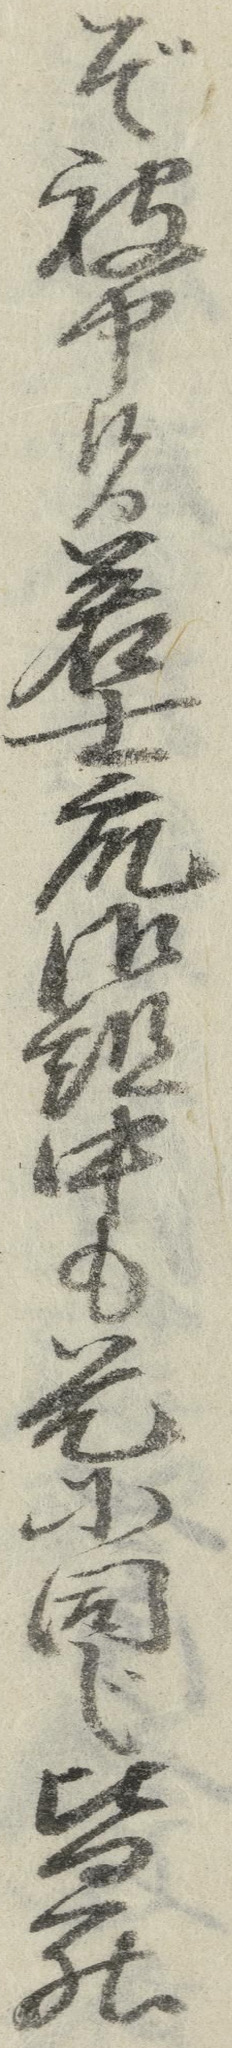ぞ被申ける若士衆御組中も是に同じ皆罷
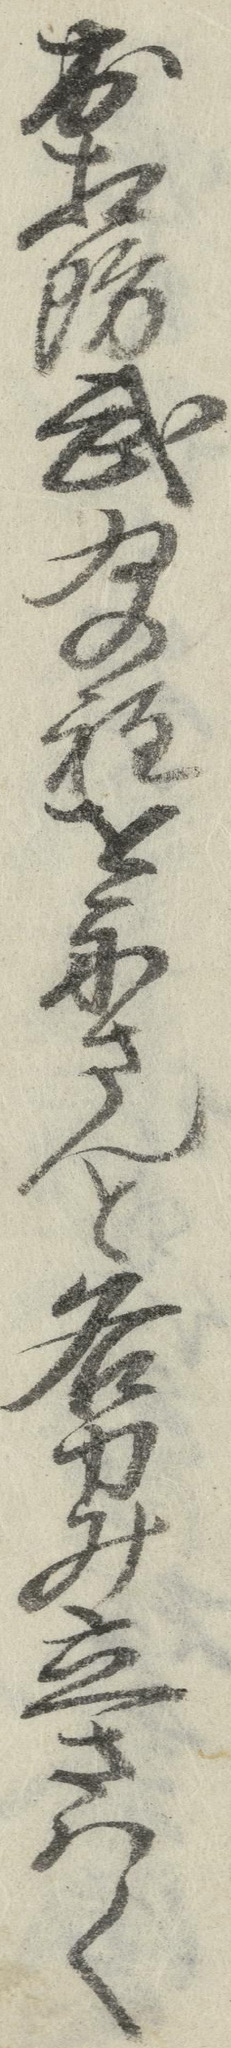出相防武力の程を示さんと各力み立さはく
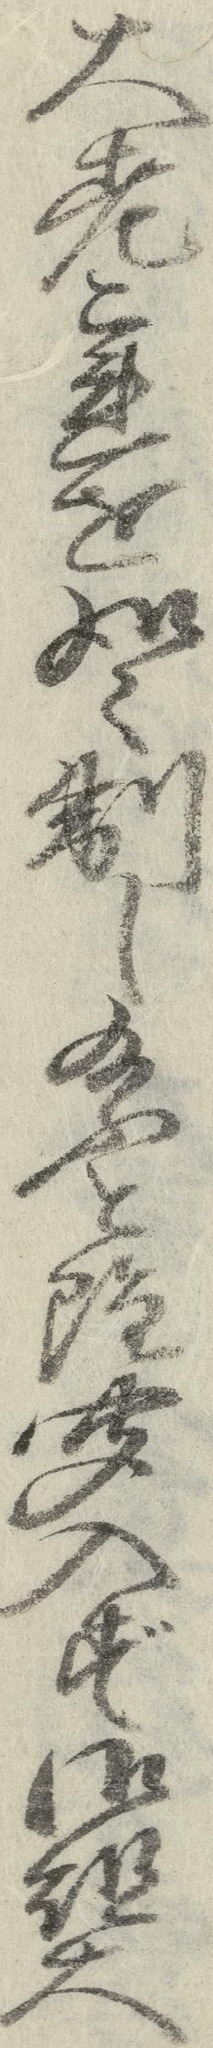大老これを如々制し給ふと雖聞入ず御組大
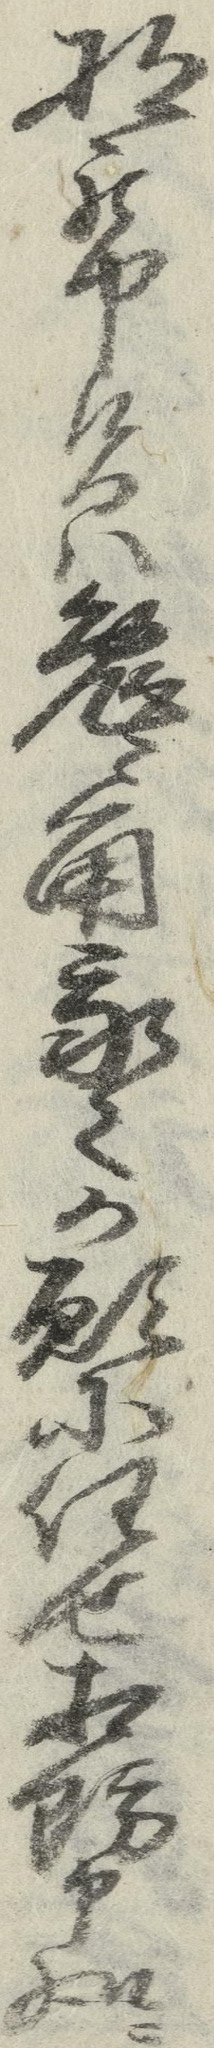将被申けるは兎に角我々か願に任せ相防申如に
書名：浅間大焼騒動記　下
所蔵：東京大学地震研究所図書室 Earthquake Research Institute Library, The University of Tokyo, JAPAN
